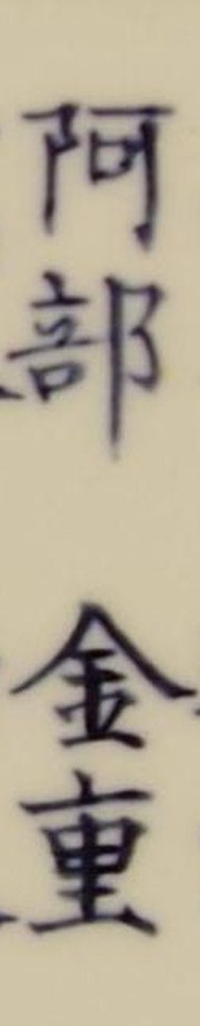阿部金重
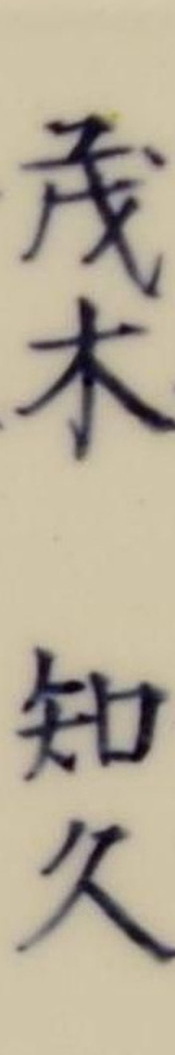茂木知久
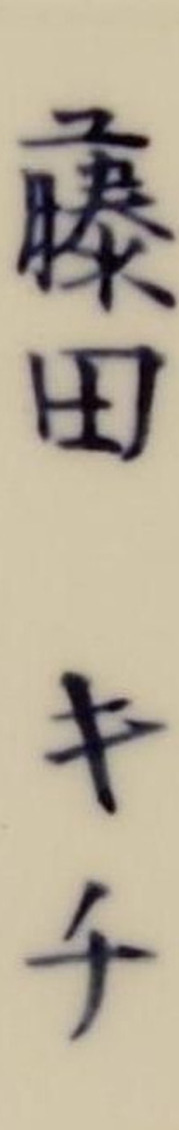藤田キチ
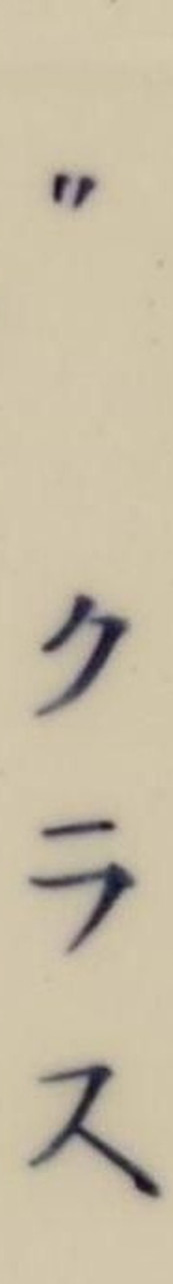クラス
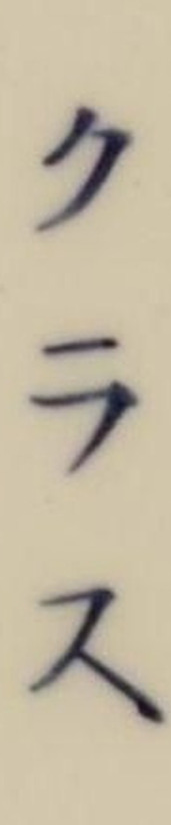クラス
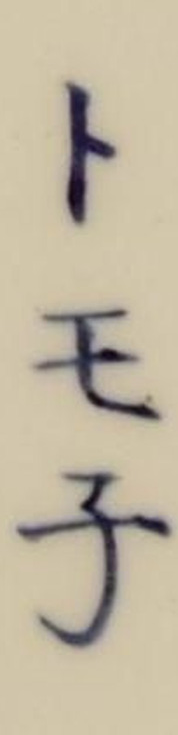トモ子
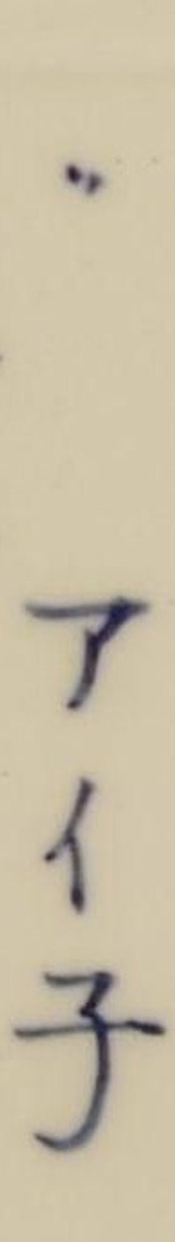アイ子
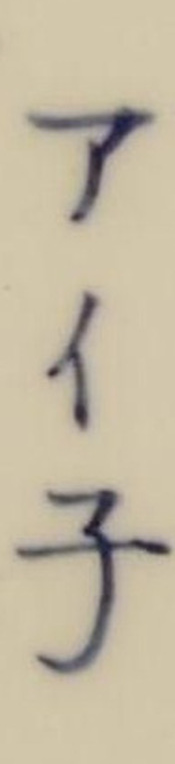アイ子
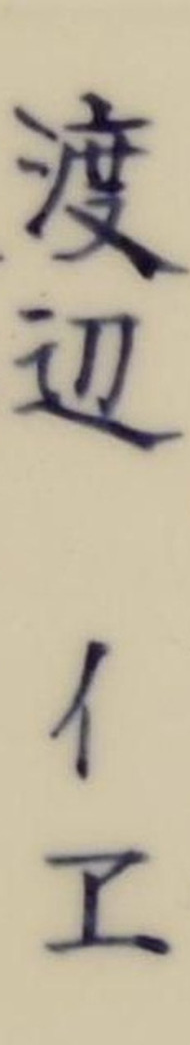渡辺イエ
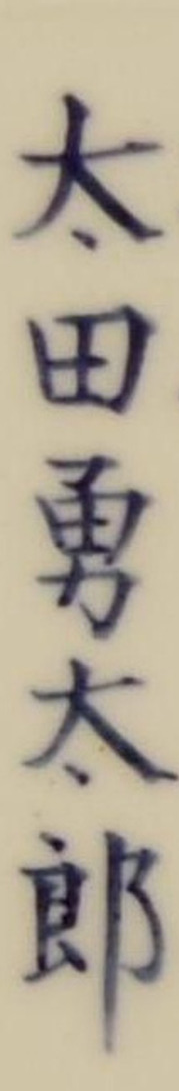太田勇太郎
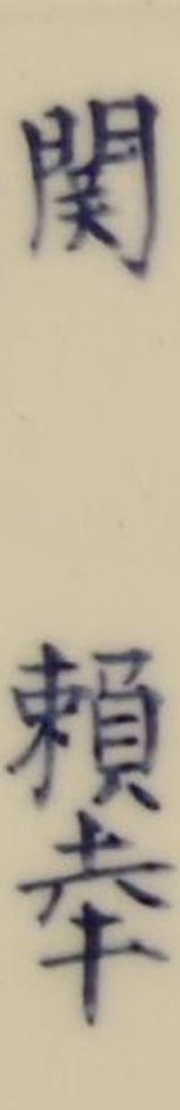関頼幸
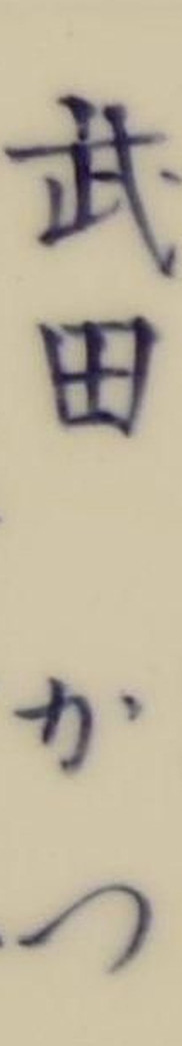武田かつ
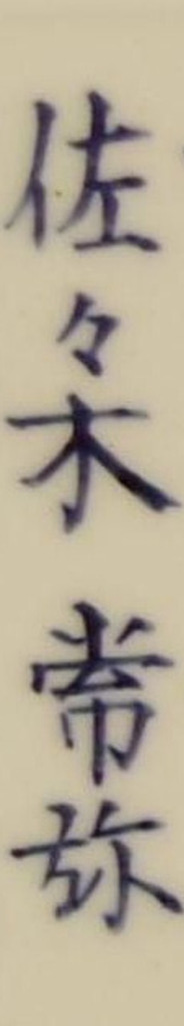佐々木常弥
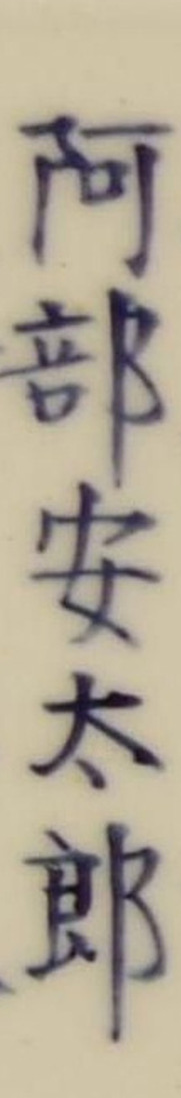阿部安太郎
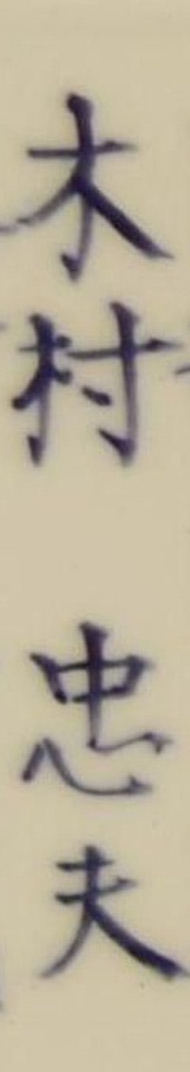木村忠夫
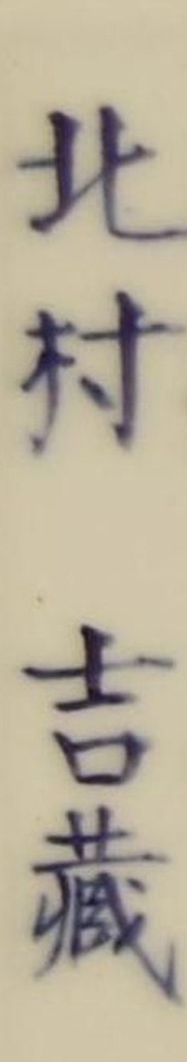北村吉蔵
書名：E~L
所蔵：高野山金剛峯寺
